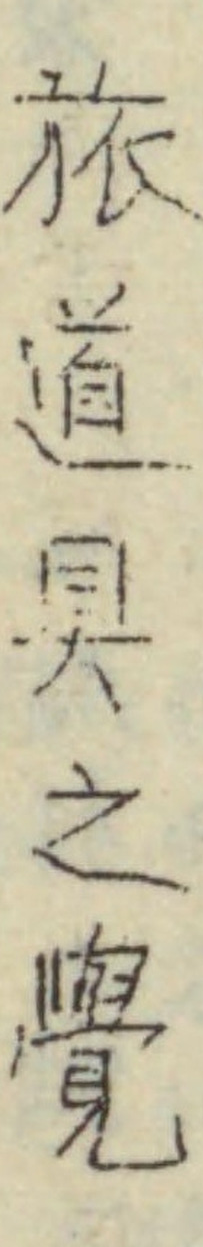旅道具之覚
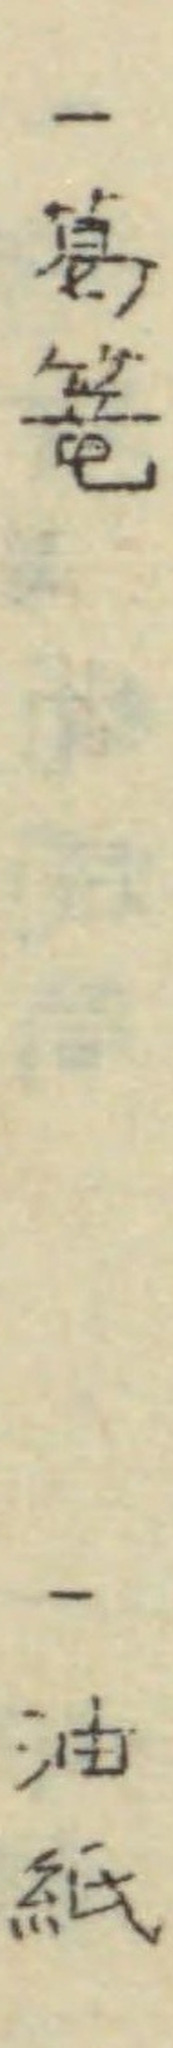一葛篭一油紙

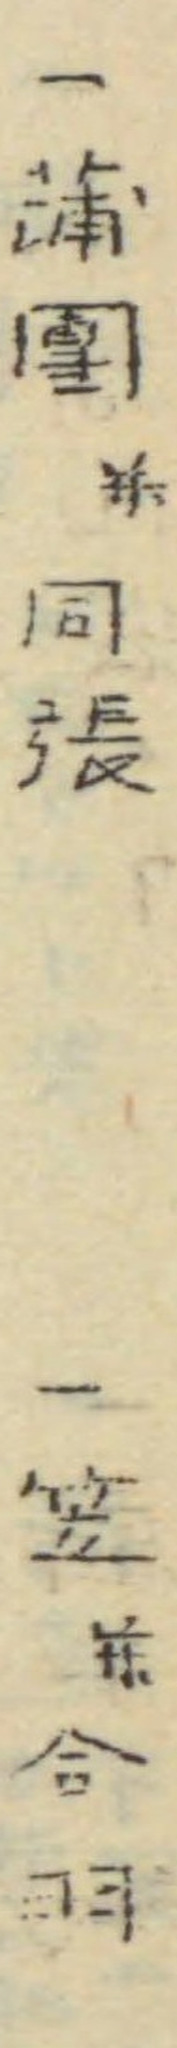一蒲団并同張一笠并合羽
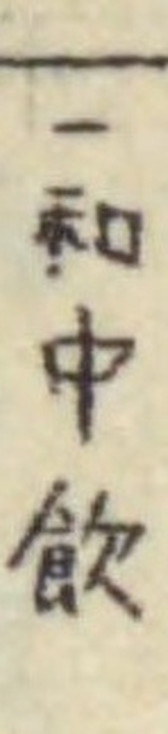一和中飲
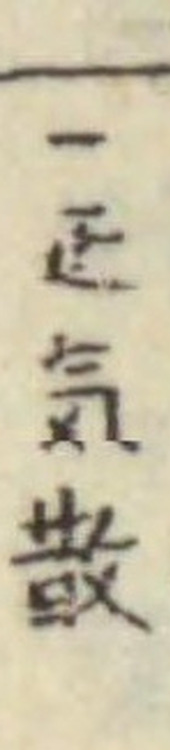一正気散
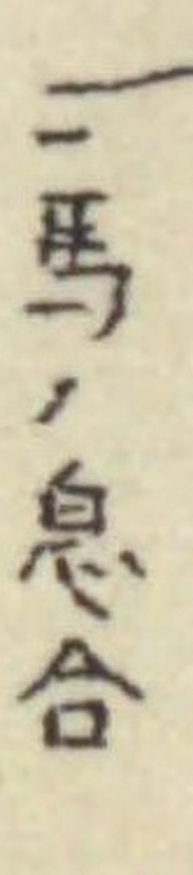一馬ノ息合
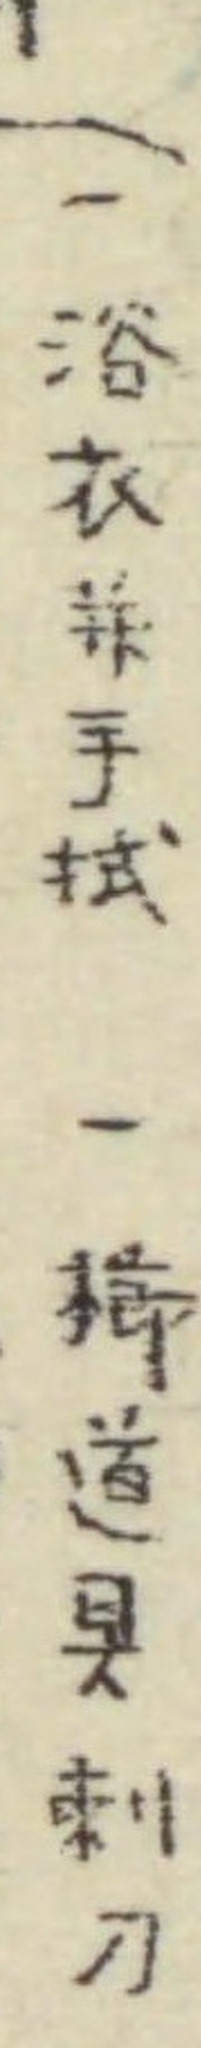柳竹一浴衣并手拭一櫛道具剃刀
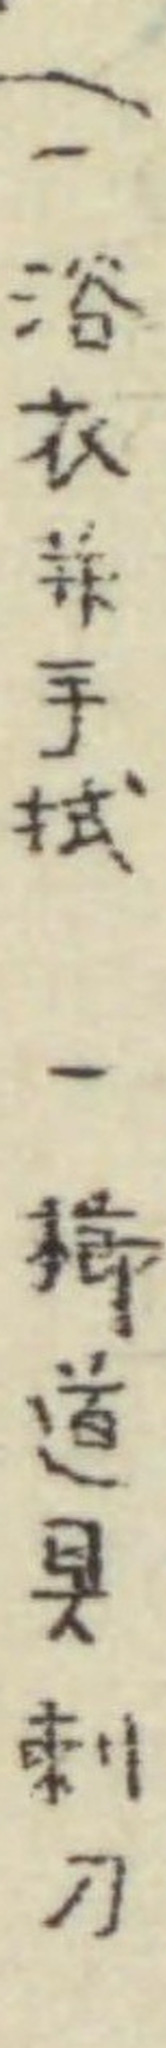柳竹一浴衣并手拭一櫛道具剃刀
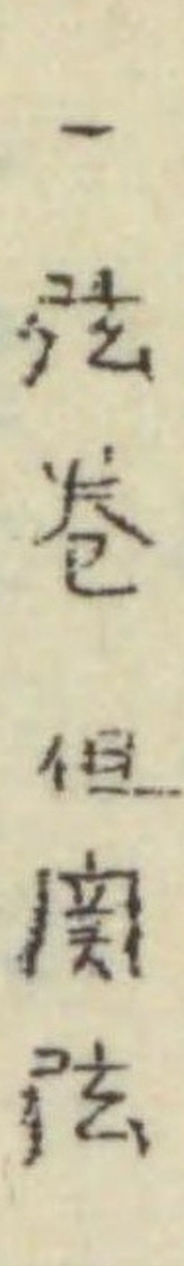一弦巻但し関弦
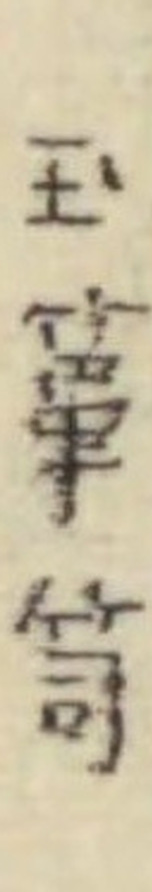玉箪笥
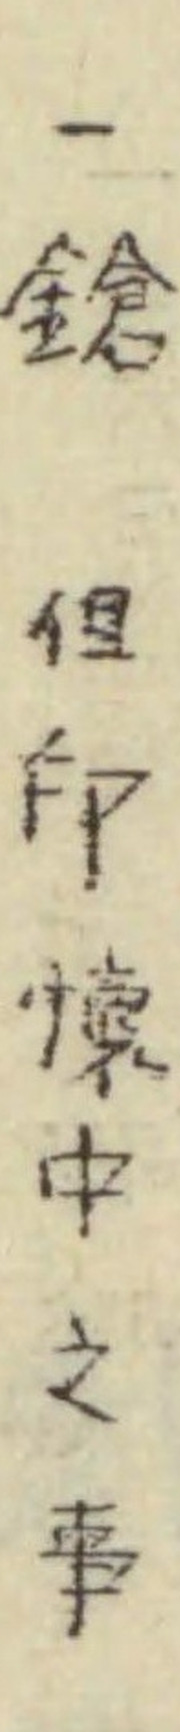一鑓但印懐中之事
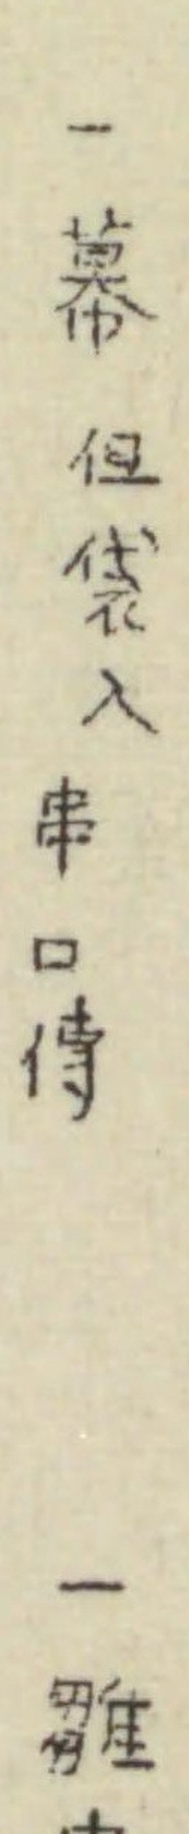一幕但袋入串口付一皴革
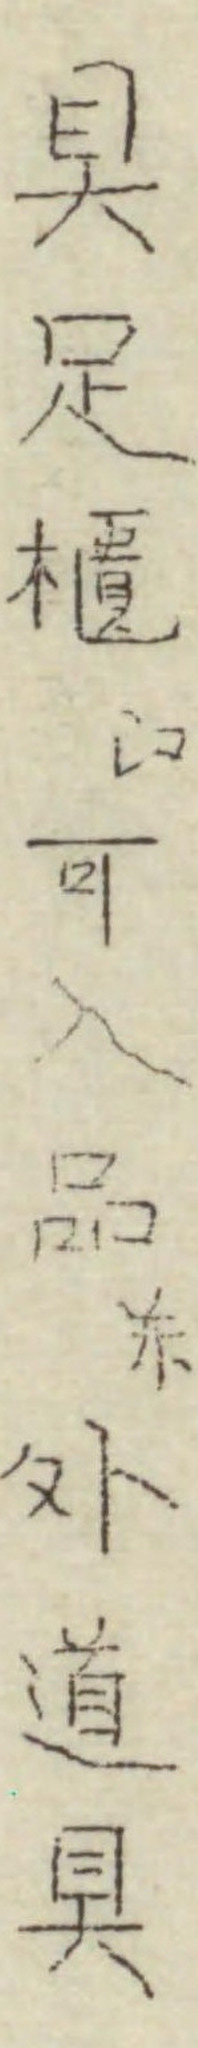具足櫃江可入品并外道具

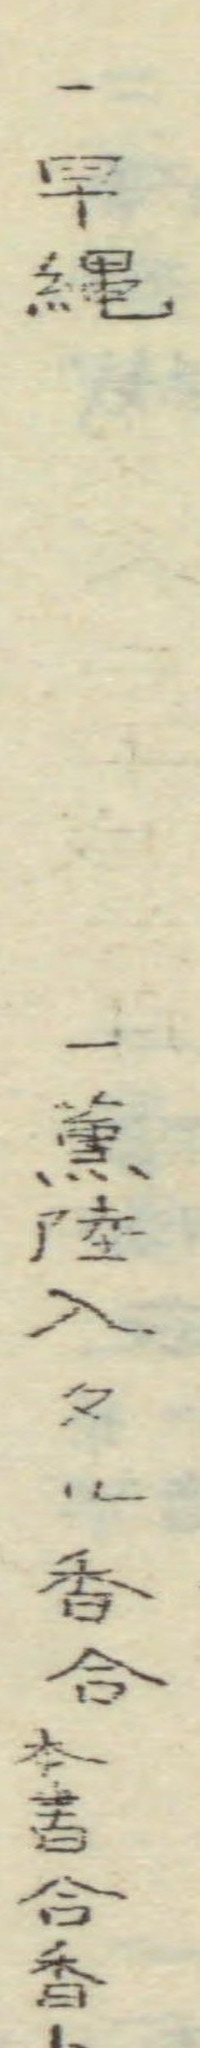一早縄一薫陸入タル香合本書香合ト有
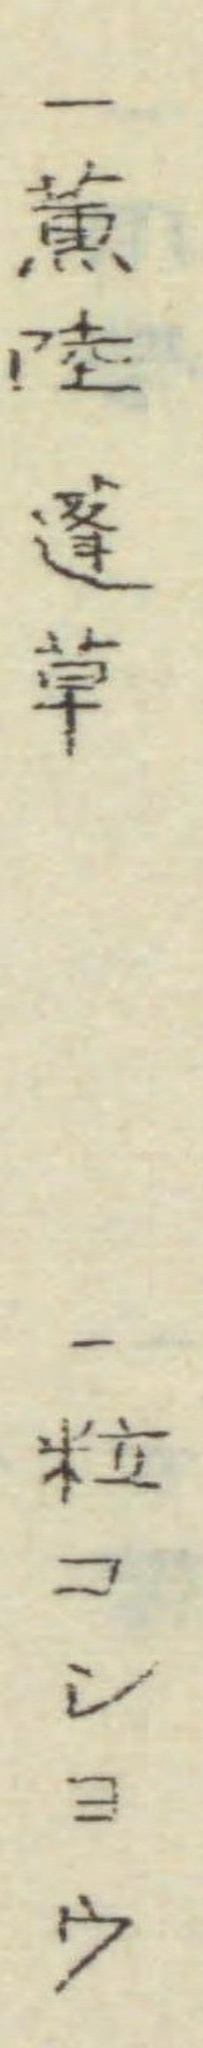一薫陸蓬草一粒コシヨウ
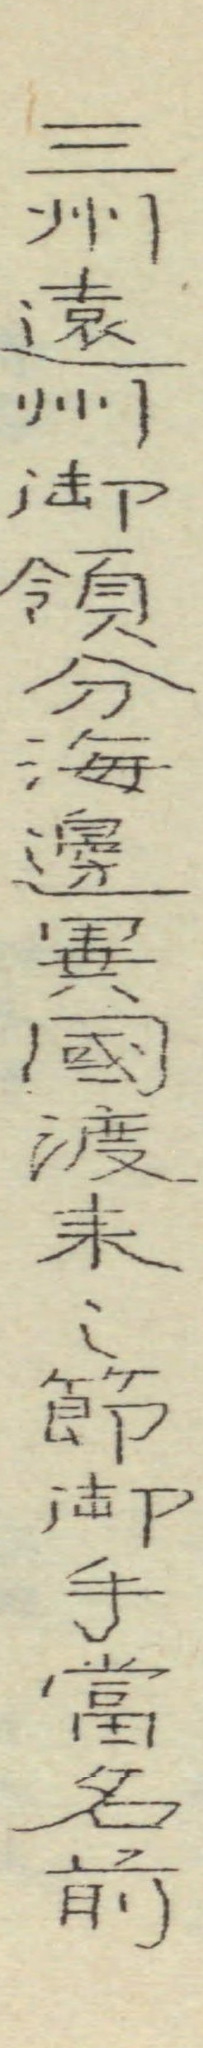三州遠州御領分海辺異国渡来之節御手当名前
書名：三河吉田藩動員史料
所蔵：国立国会図書館 National Diet Library, JAPAN
